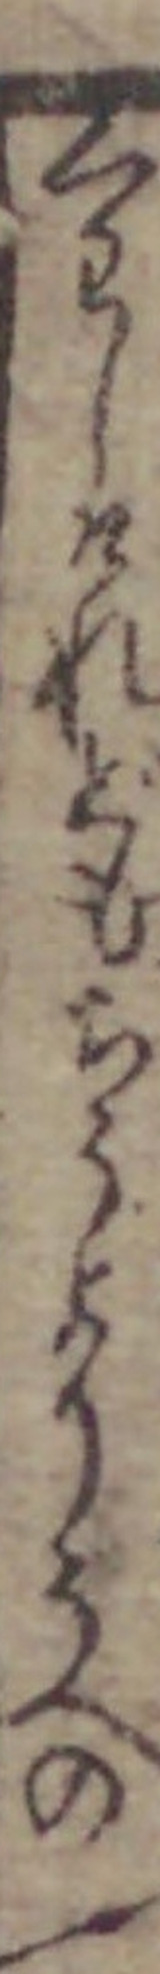くわしけれどもちうよりうへの
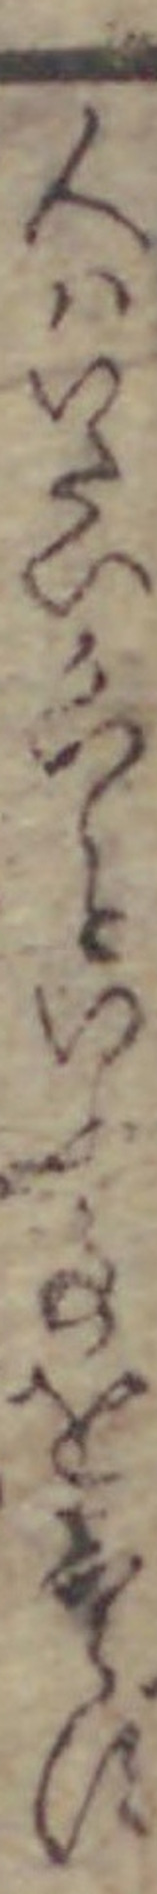人はいたいかいといふ事をしらず
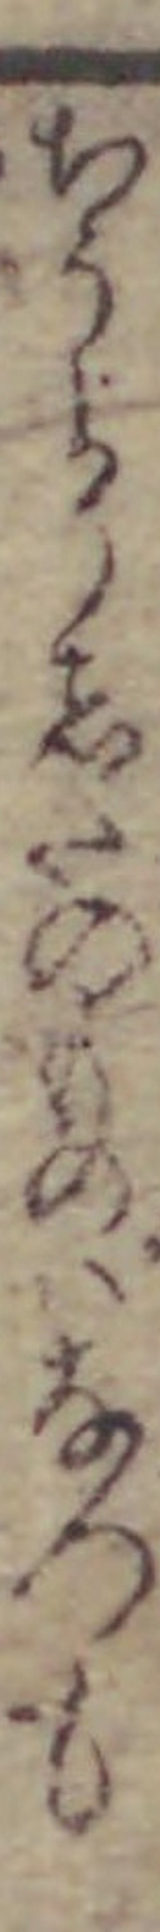ちうよりしたのものはなつも
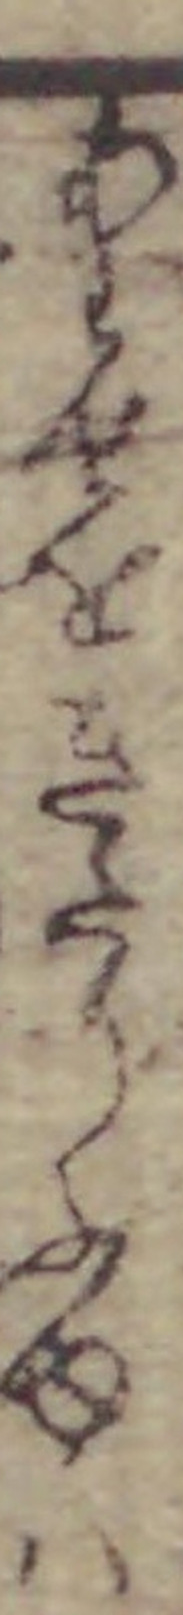あわせをきたりふゆは
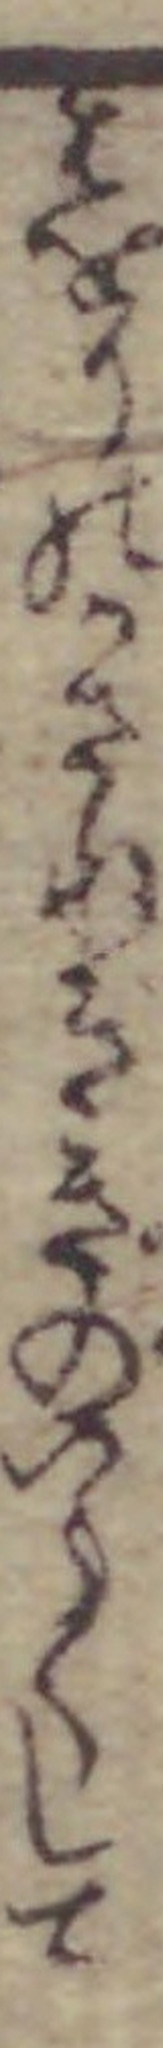はをりのかさねききのいらくして
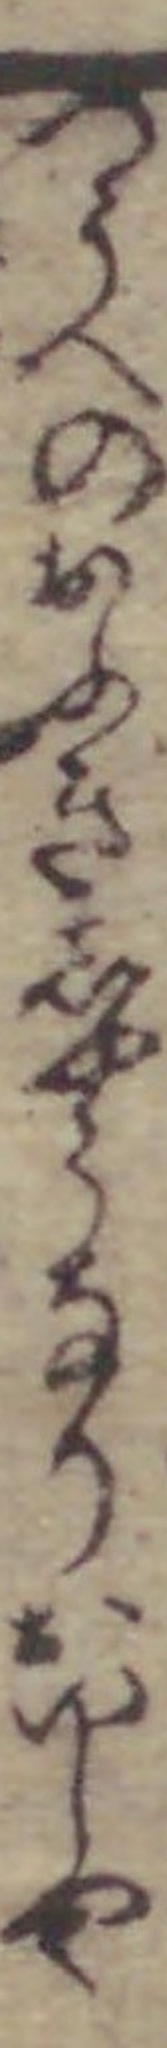つう人のおふきしやうなりおいしや
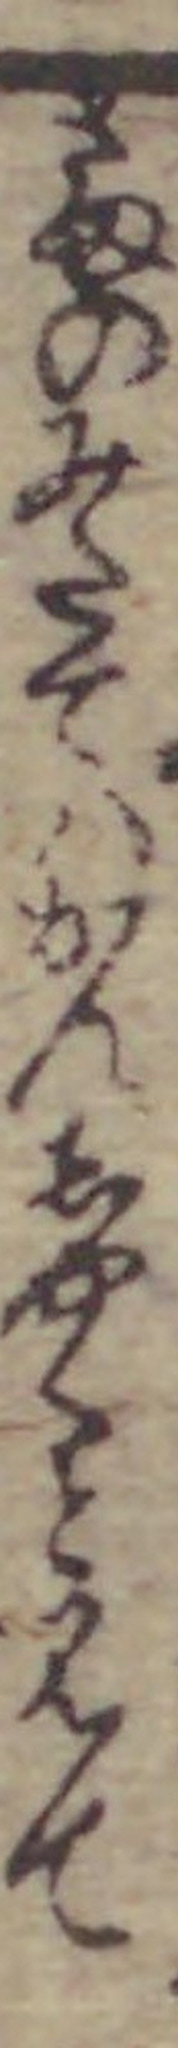さまのみたてはかんしやくと見て
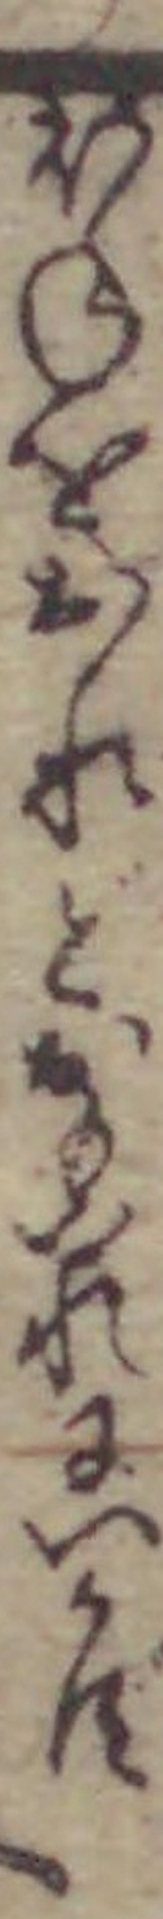ほねをおれどおもいれにいかず
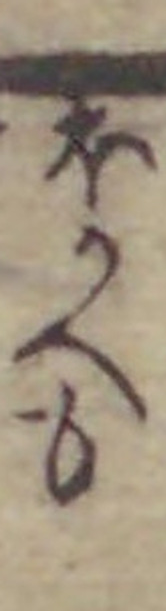ほかへも
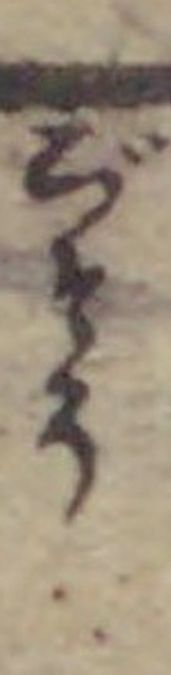ごそう
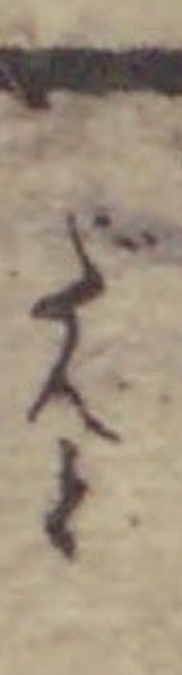だんと
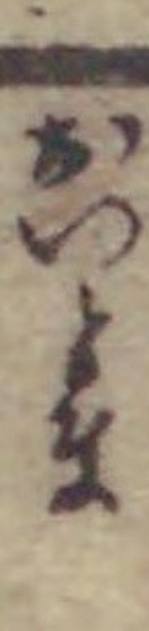おいとま
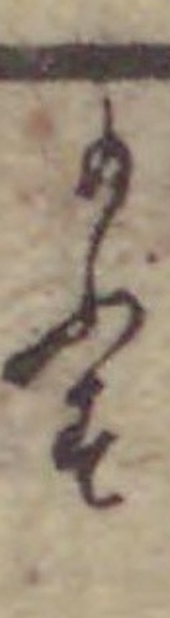もふす

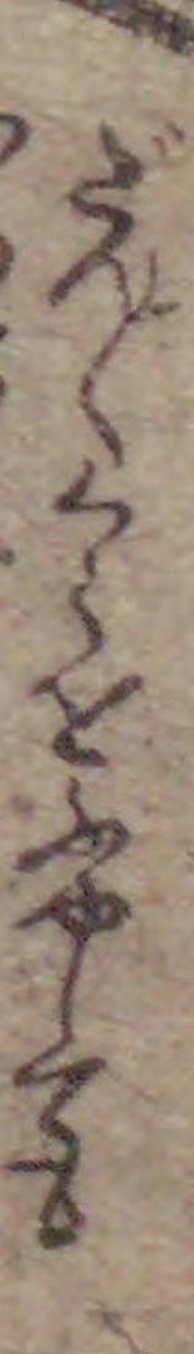だん〳〵くらをふやしても
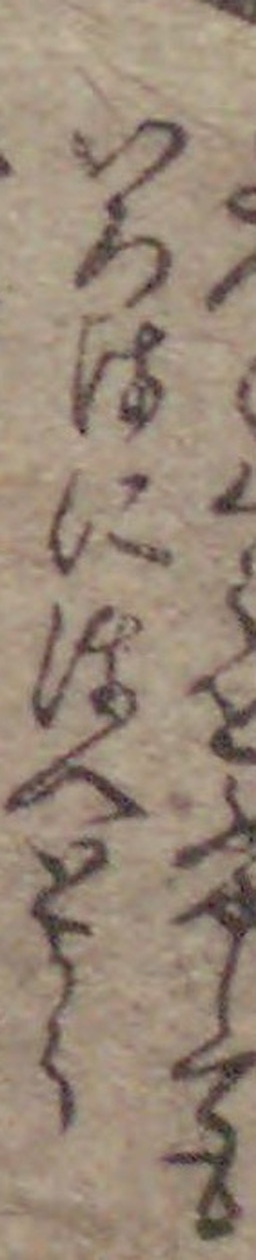いろはにほへとから
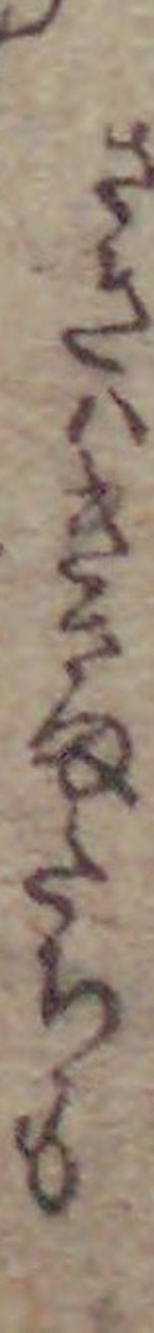さきはきさまたちも
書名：御代の御寶
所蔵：国立国会図書館 National Diet Library, JAPAN
